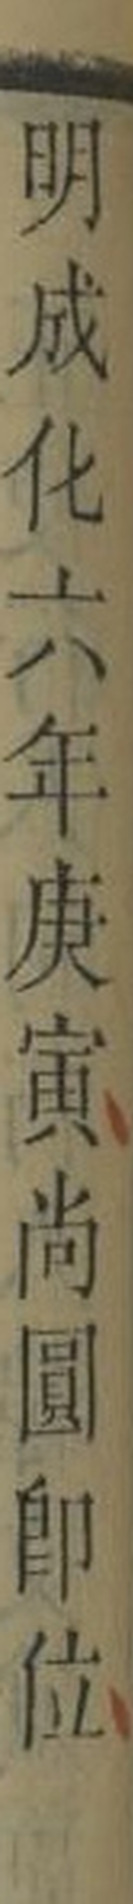明成化六年庚寅尚円即位
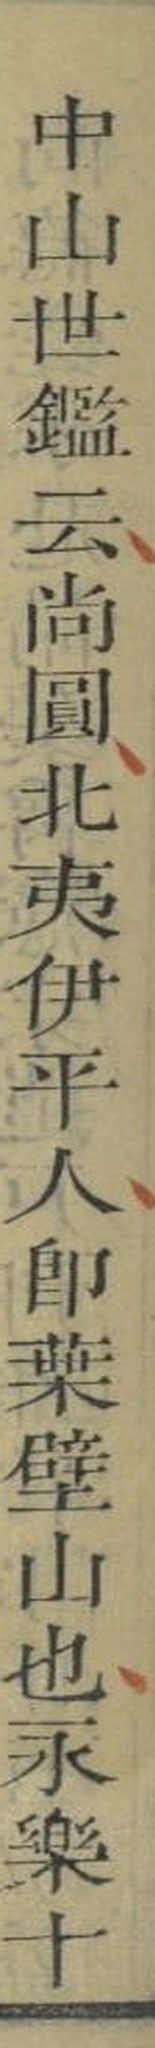中山世鑑云尚円北夷伊平人即葉壁山也永楽十
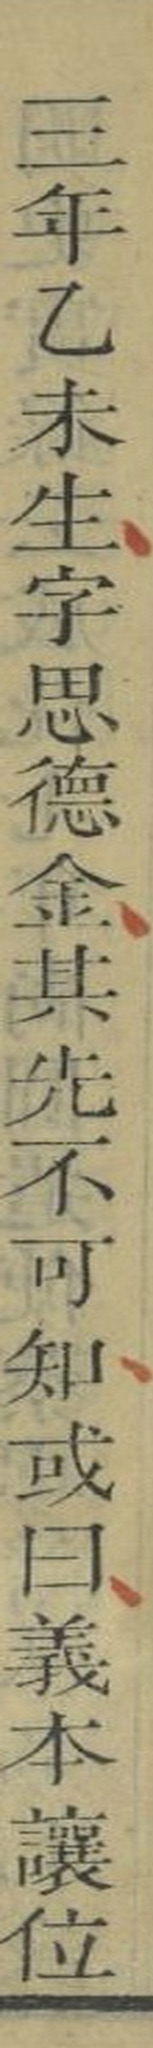三年乙未生字思徳金其先不可知或曰義本譲位
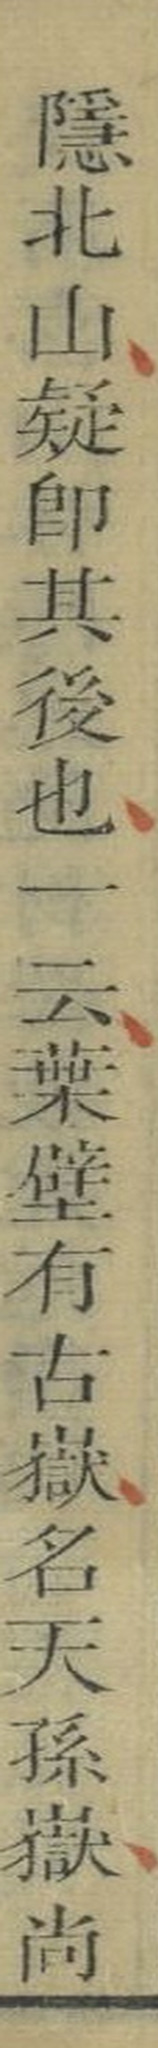隠北山疑即其後也一云葉壁有古岳名天孫岳尚
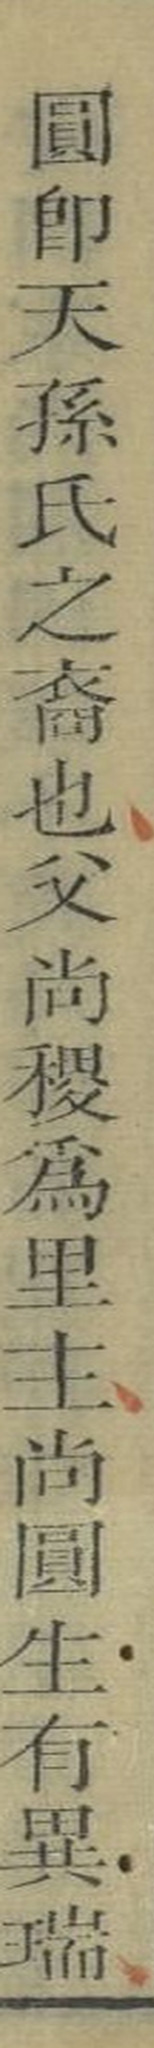円即天孫氏之裔也父尚稷為里主尚円生有異瑞
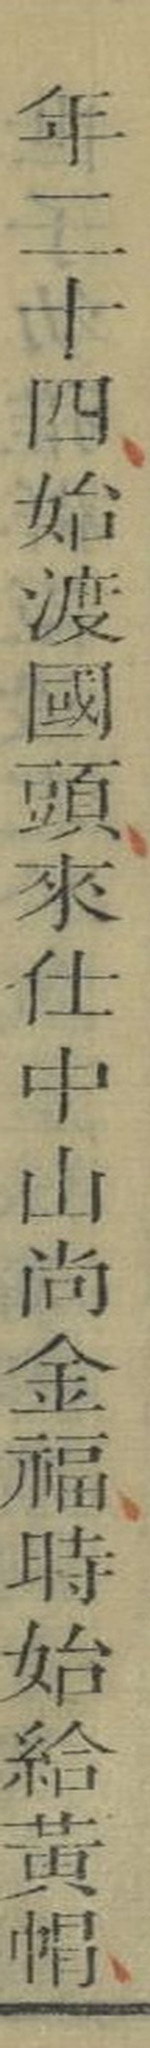年二十四始渡国頭来仕中山尚金福時始給黄帽
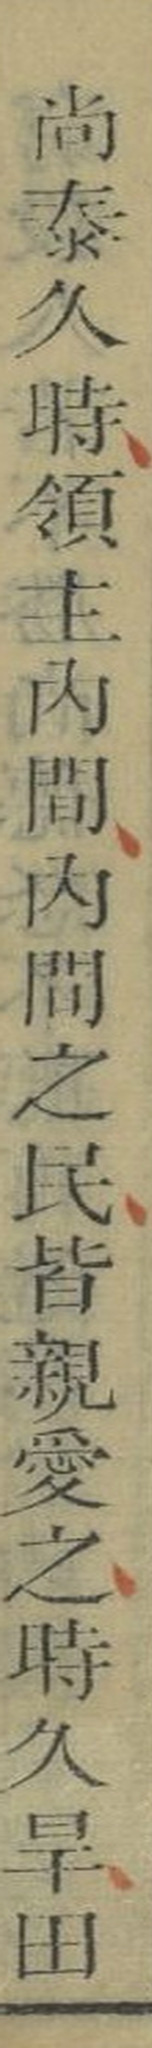尚泰久時領主内間内間之民皆親愛之時久旱田
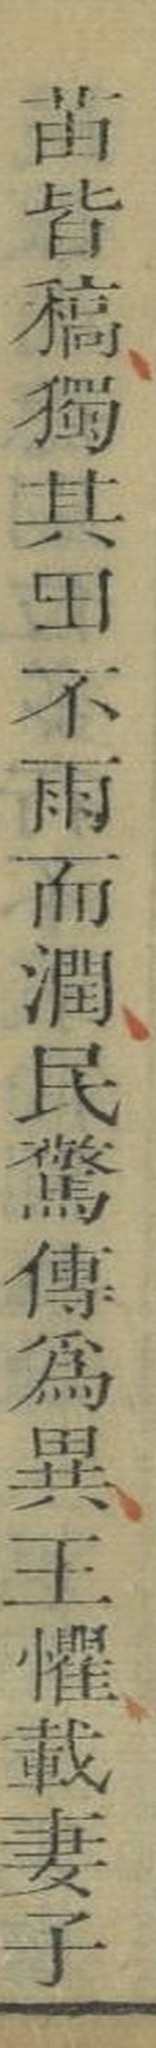苗皆稿独其田不雨而潤民驚伝為異王懼載妻子
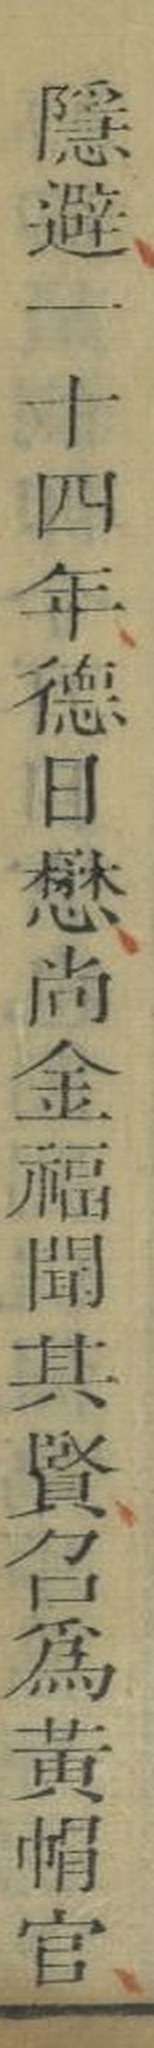隠避一十四年徳日懋尚金福聞其賢召為黄帽官

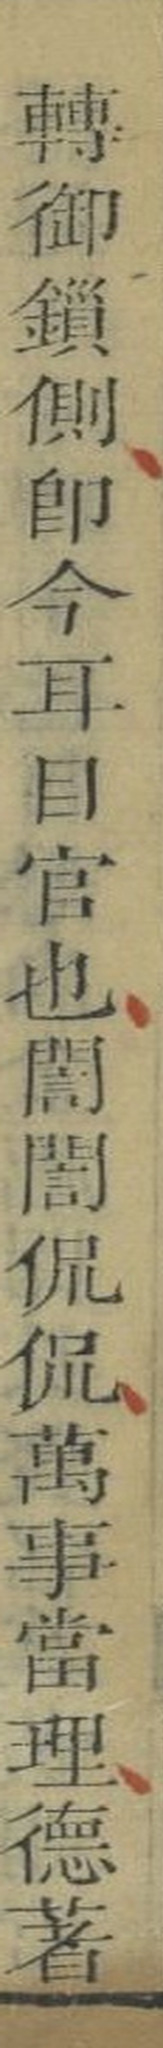転御鎖側即今耳目官也誾誾侃侃万事当理徳著
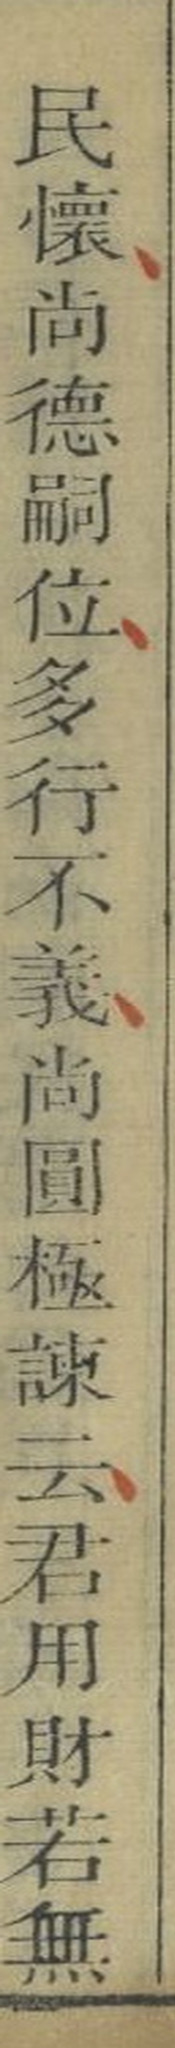民懐尚徳嗣位多行不義尚円極諫云君用財若無
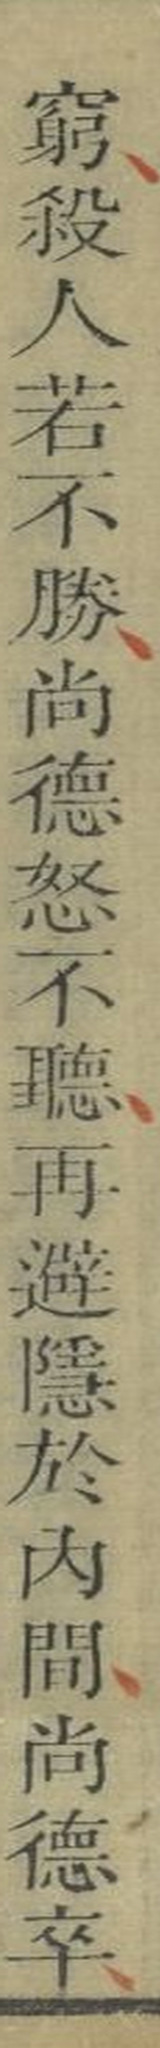窮殺人若不勝尚徳怒不聴再避隠於内間尚徳卒
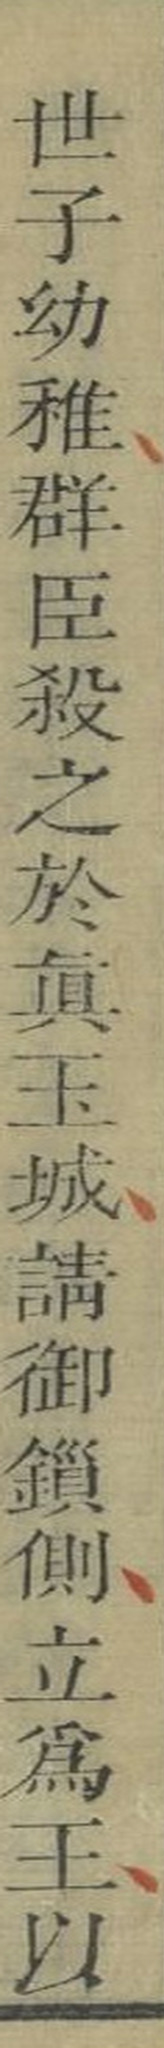世子幼稚群臣殺之於真玉城請御鎖側立為王以
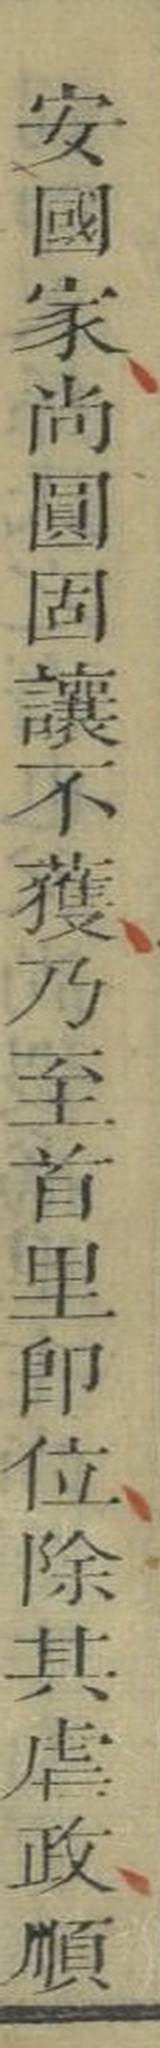安国家尚円固譲不獲乃至首里即位除其虐政順
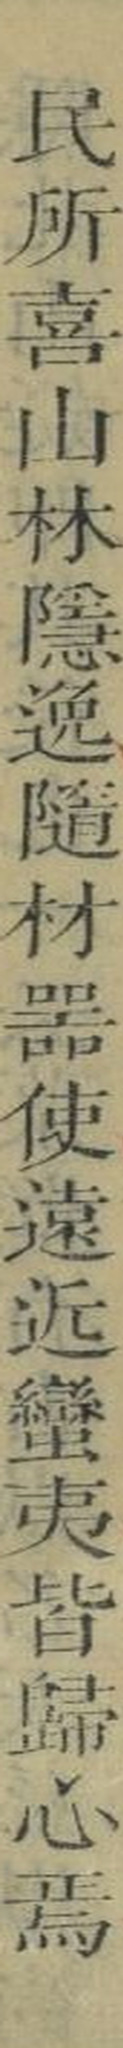民所喜山林隠逸随材器使遠近蛮夷皆帰心焉
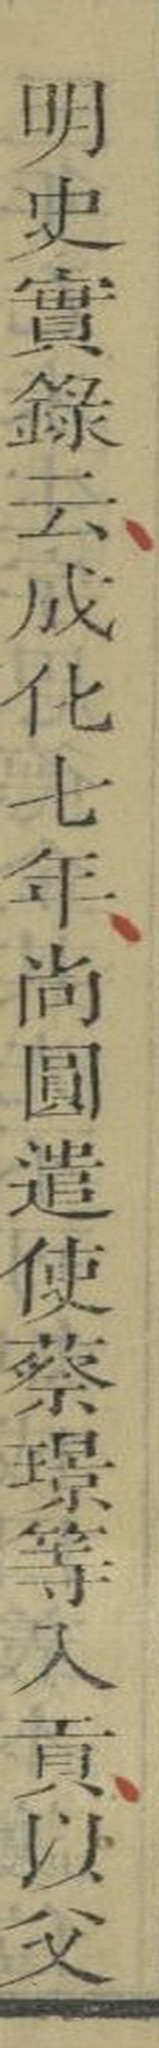明史実録云成化七年尚円遣使蔡璟等入貢以父
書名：中山伝信録 巻三
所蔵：University of the Ryukyus Library
